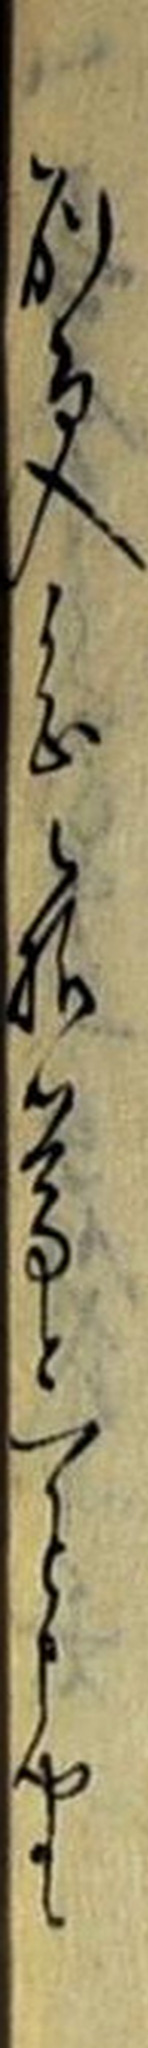別而入念候様篤と可被申聞候
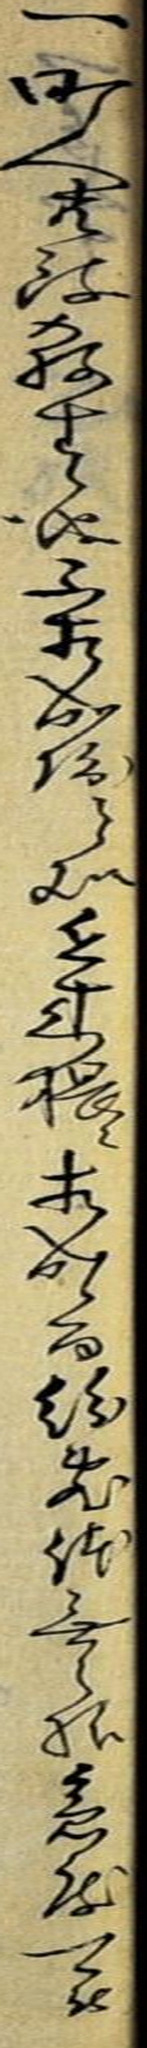一町人共致殺生候儀不相成儀ニ候処近来猥ニ相成候間紛敷体無之様急度可被
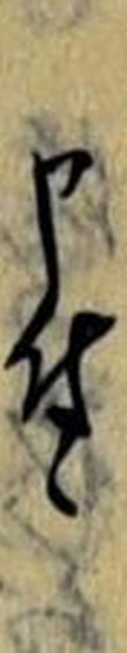申付候
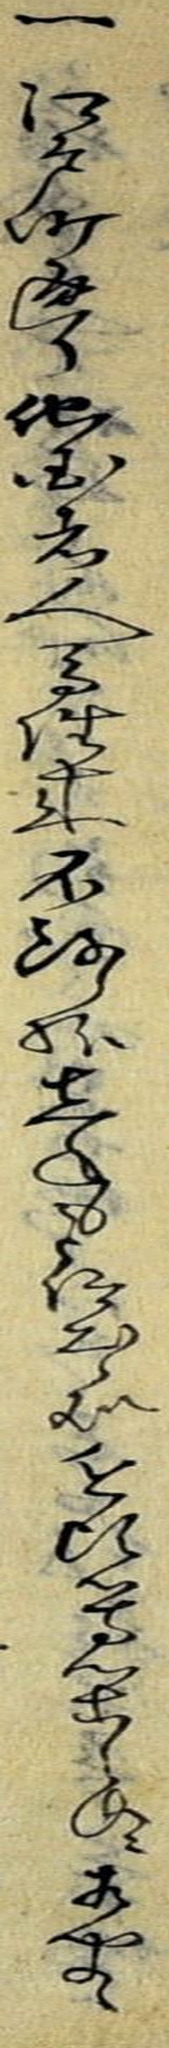一江戸町通り他国者人馬往来不致様先年も被仰出候処近頃等閑之趣ニ相聞候
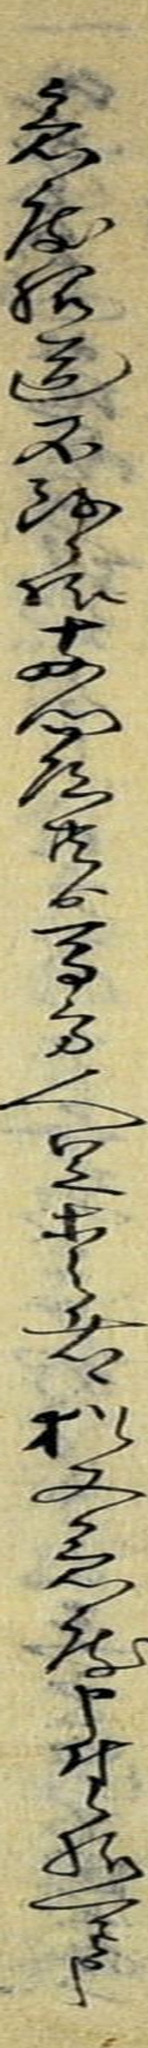急度脇道不致候様両問屋共ゟ馬方人足等之者へ尚又急度申付候様可被申
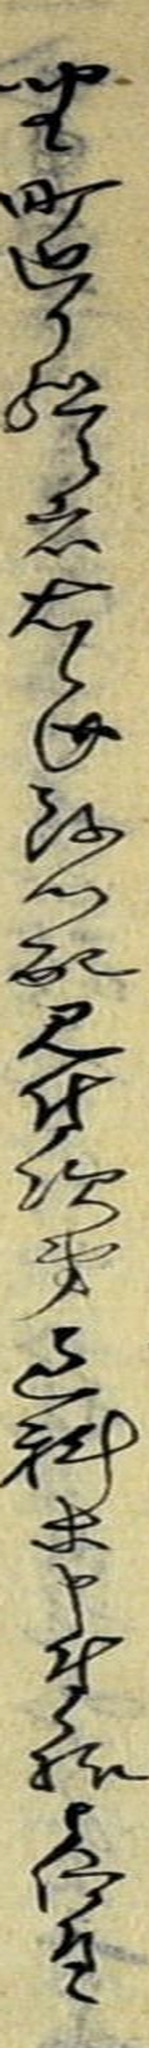聞候町廻り組之者右之趣致心配見付次第過料等申付候様被仰付候
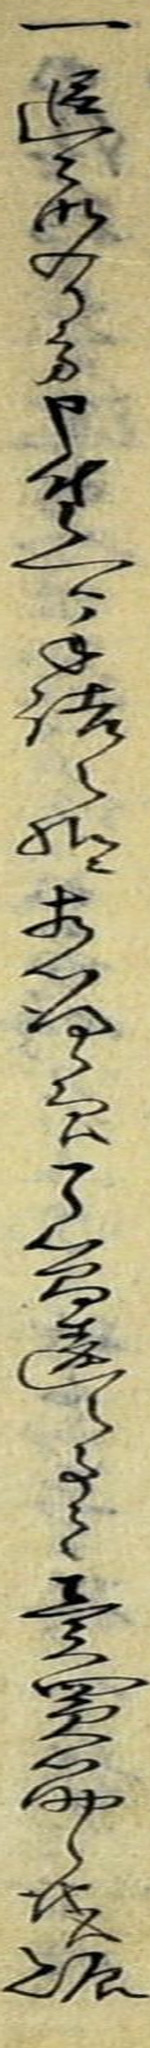一追々御〆り方申付候ヘハ手詰之様ニ相心得候而ハ了簡違之事ニ候売買筋之儀ハ賑
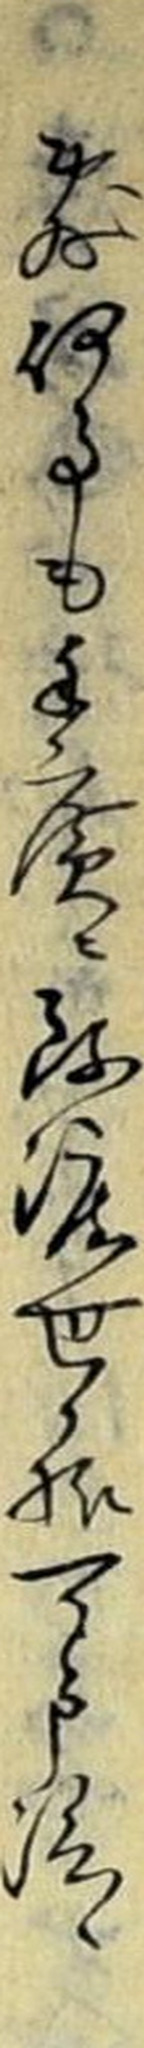敷何事も手広ニ致渡世候様可被申渡候
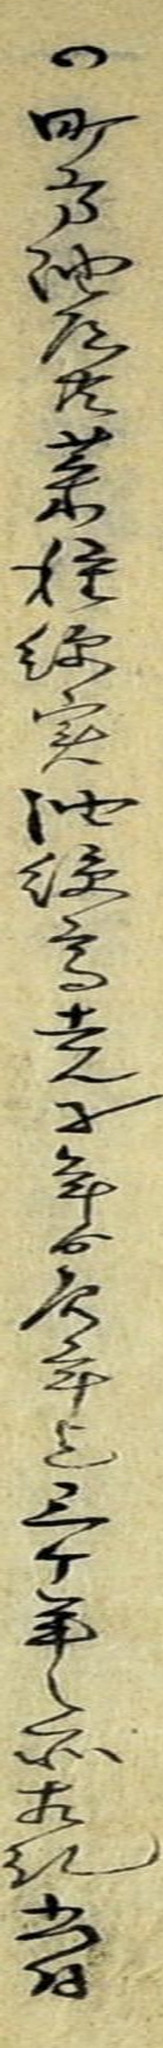〇町方油屋共菜種綿実油絞高去ル寅年ゟ辰年迄三ケ年之所相糺書付
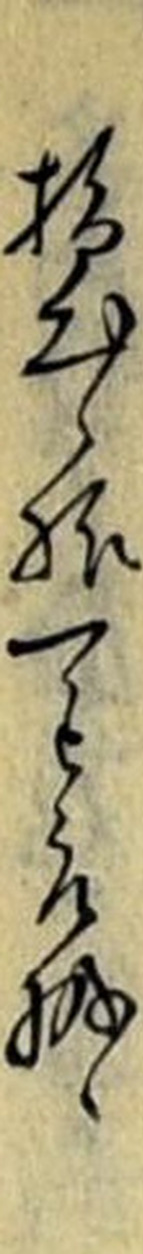指出候様可被取扱候
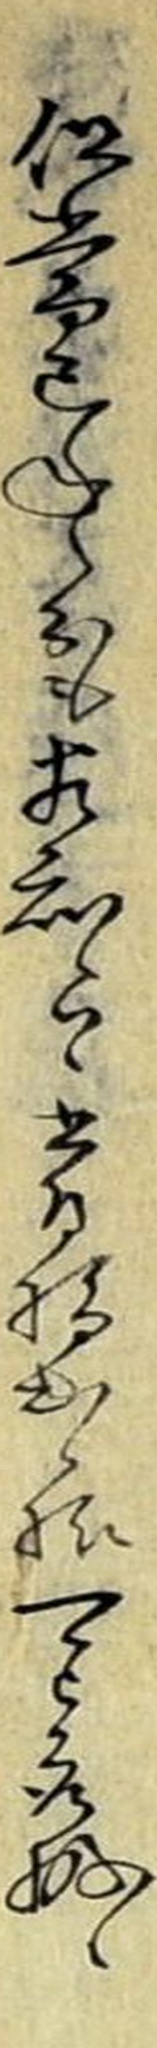但当巳年之分も相知候ハヽ書付指出候様可被取扱候
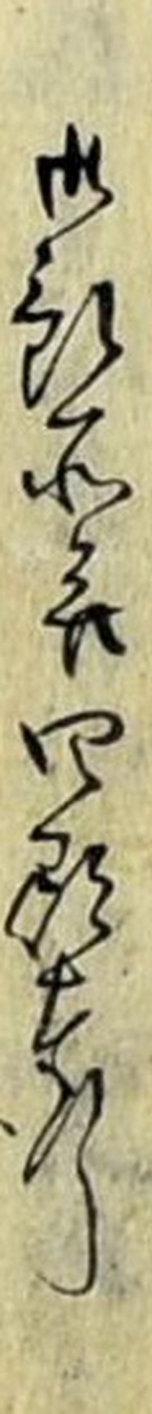御預所并四郡奉行
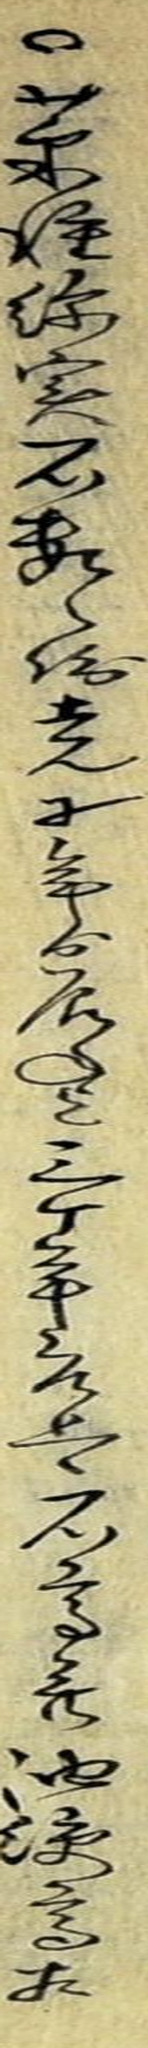〇菜種綿実石数之儀去ル寅年ゟ辰年迄三ケ年取上候石高并油絞高相
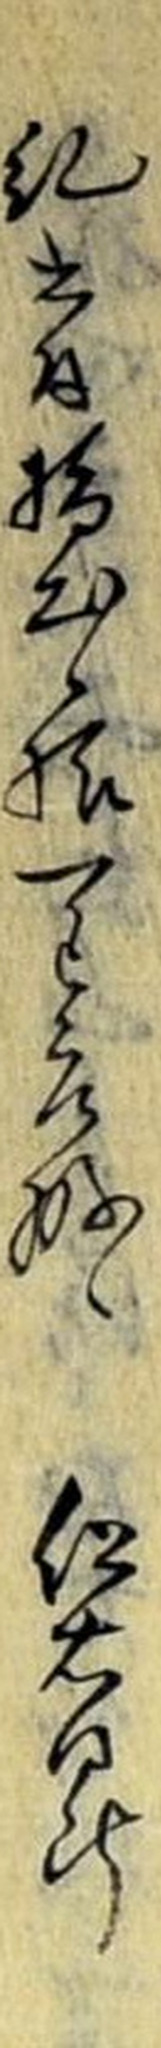記書付指出候様可被取扱候但右同断
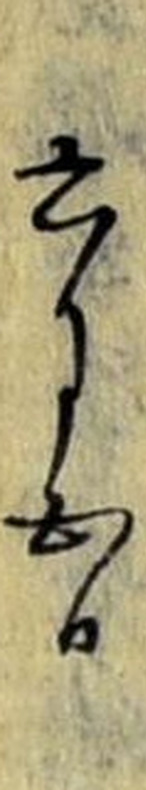六月五日

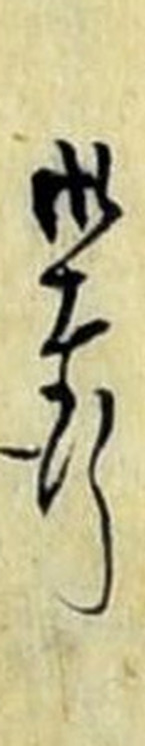御奉行
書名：命令之部 三
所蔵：福井県文書館 Fukui Prefectural Archives
